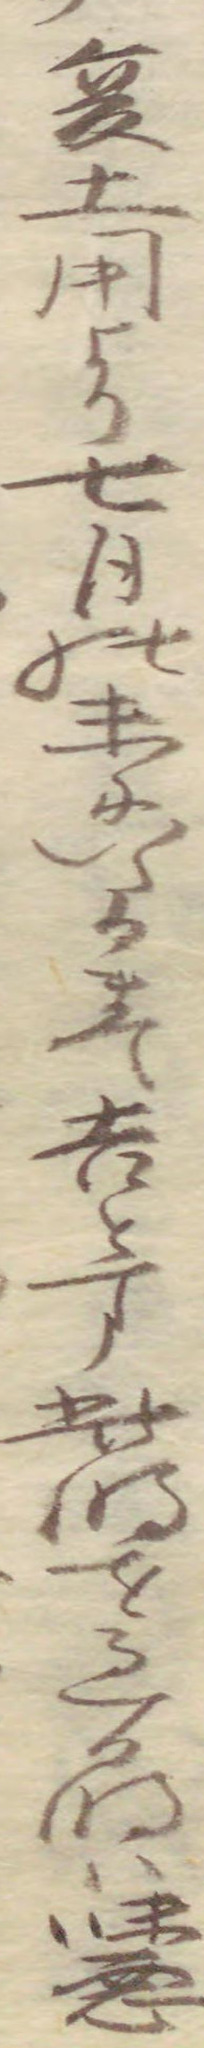夏土用より七月の末にいたるまて吉とす此時を過る時は味悪
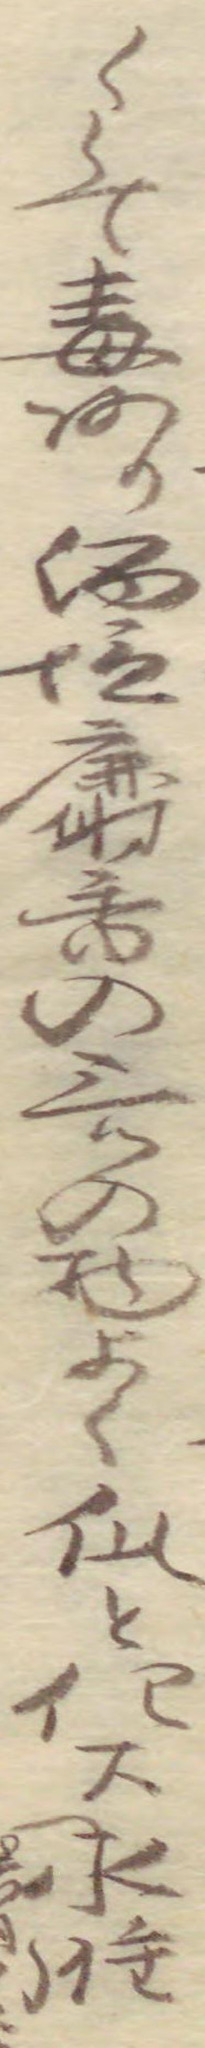くして毒あり酒塩麝香の三ツの物よく瓜と化ス水腫
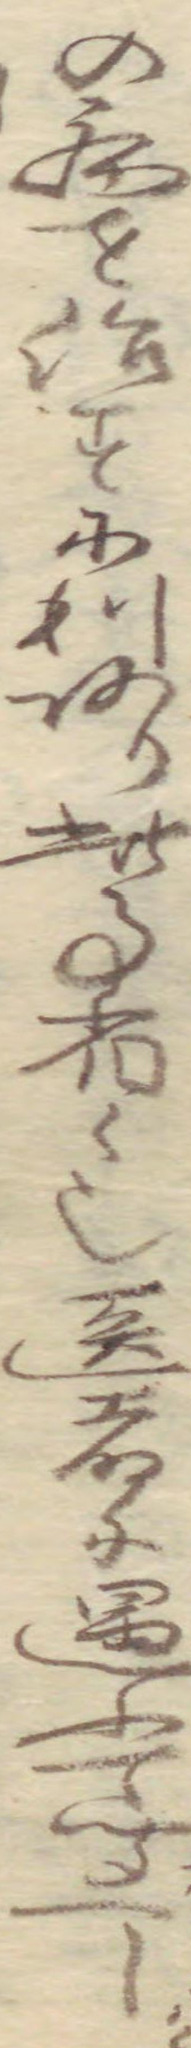の病を治すに利あり此事省く也医者に遇ふて聞へし
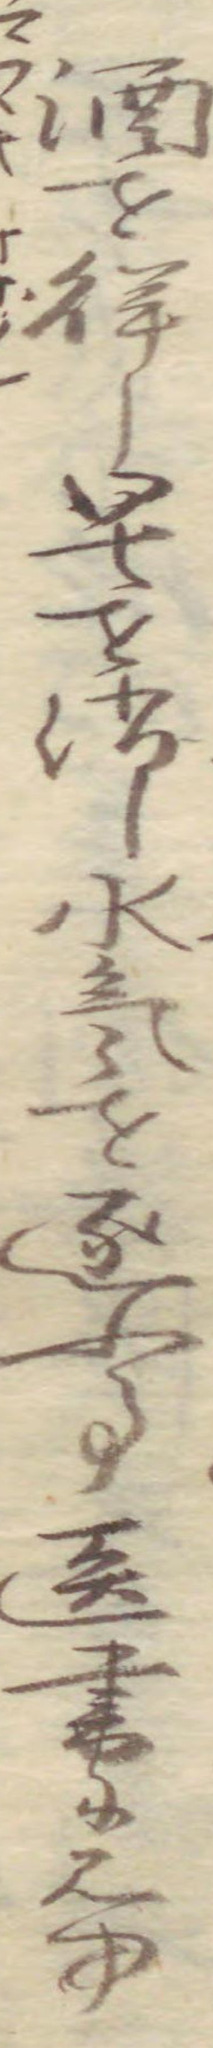酒を觧し暑を消し水気を逐ふ事医書に見ゆ
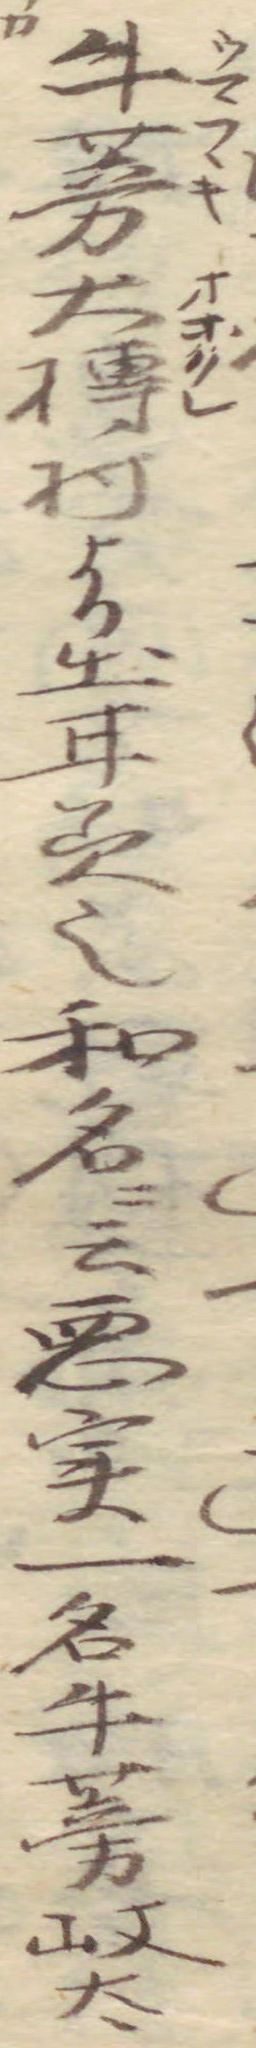牛蒡大榑村より出甘美也和名ニ云悪実一名牛蒡岐太
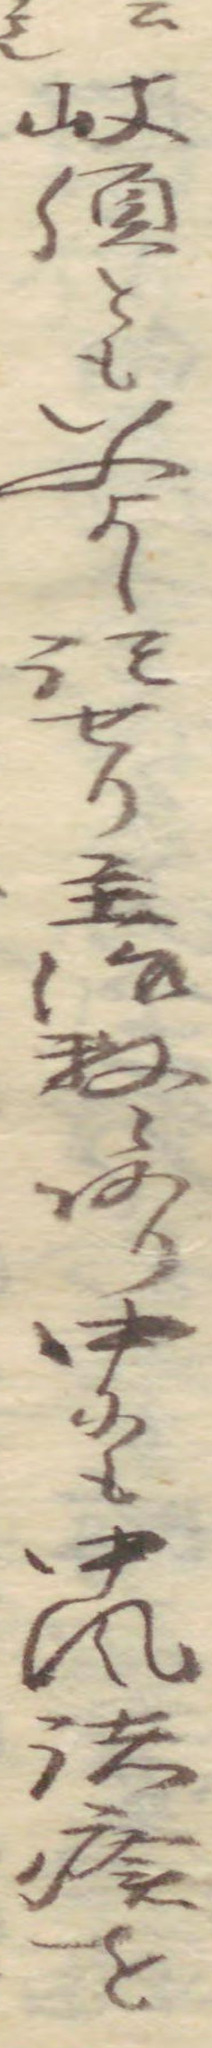岐須ともいふよし記せり主治数〻あり中にも中風諸瘡を
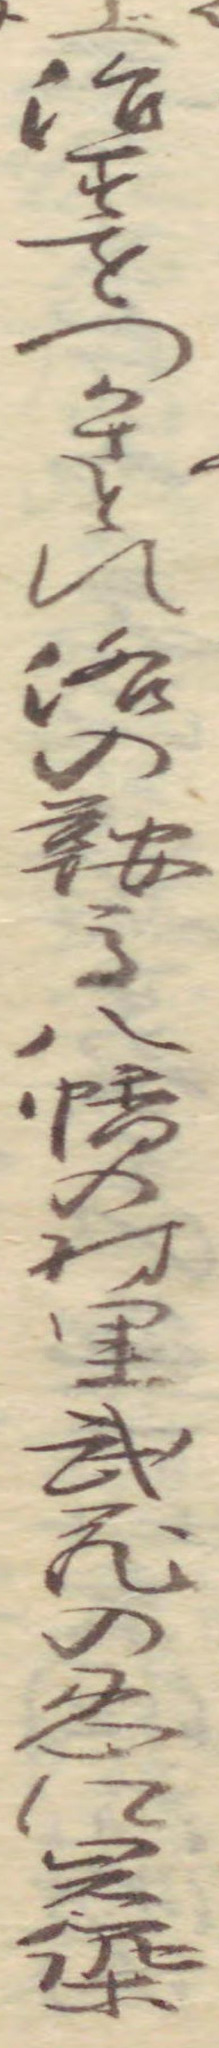治すをつかさとす洛の鞍馬八幡の村里武蔵の忍郷岩築
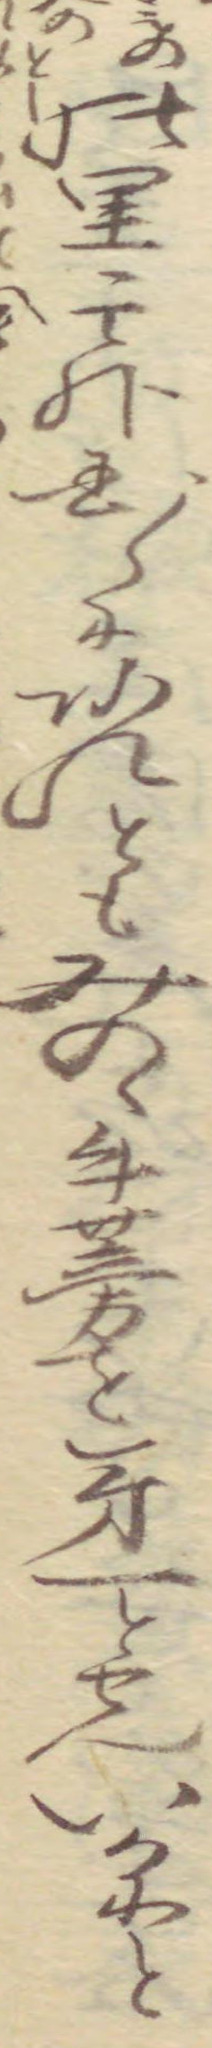の里其外国〳〵にあれともみのゝ牛蒡を第一とせんいかにと
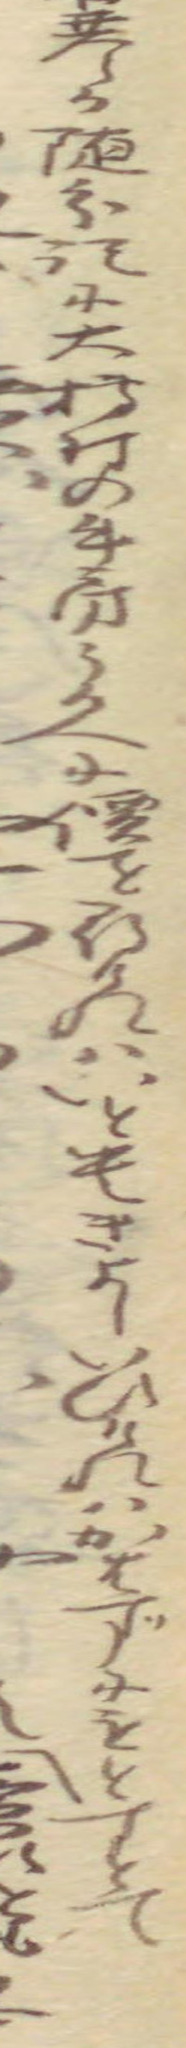有琴？か随分記に大榑村の牛房うる人に價を尋けれはいと貴きよしいひけれはかはずにもとすとて
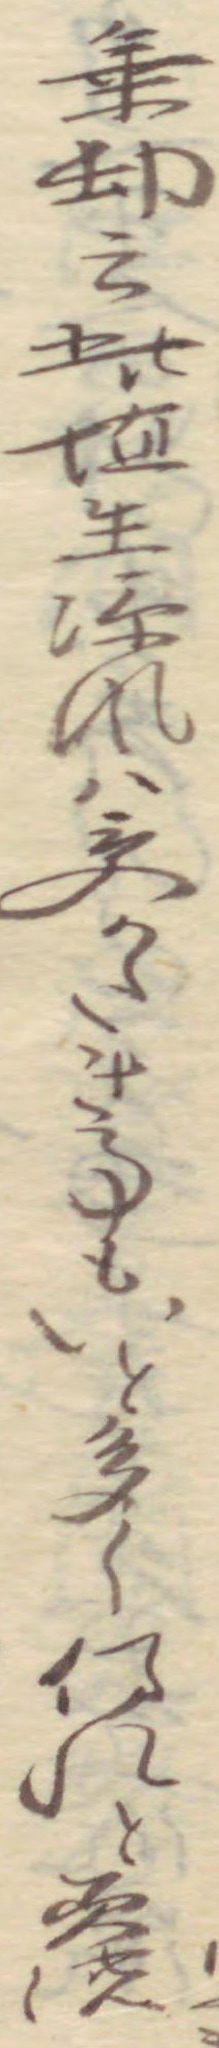乗邨云此埴生涼風は受かたき事もいと多く侍れと美濃
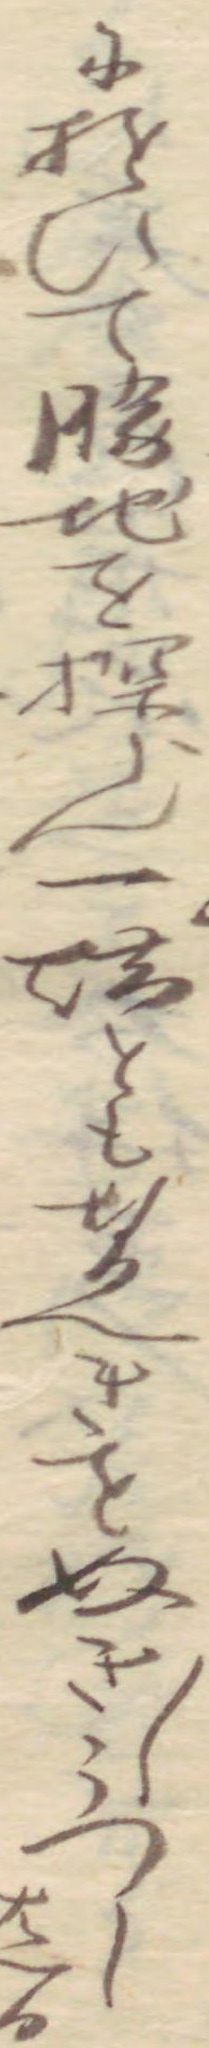に遊ひて勝地を探らん一端ともなるへきをぬき〳〵うつしはへる
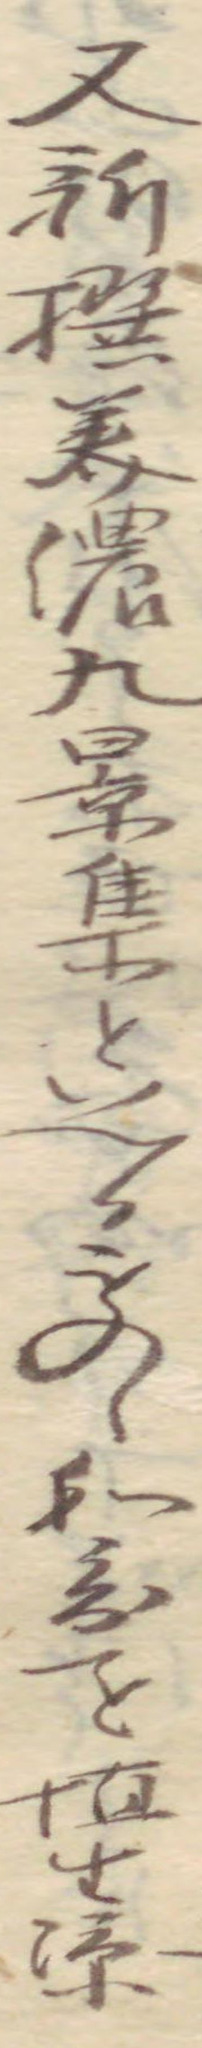又新撰美濃九景集といへるものゝ和歌を埴生涼
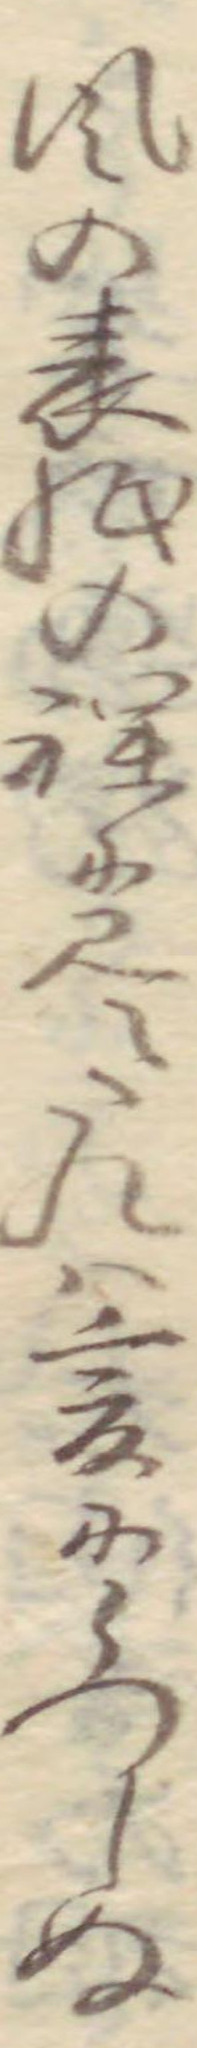風の表紙の裡に見えたれは爰にうつしぬ
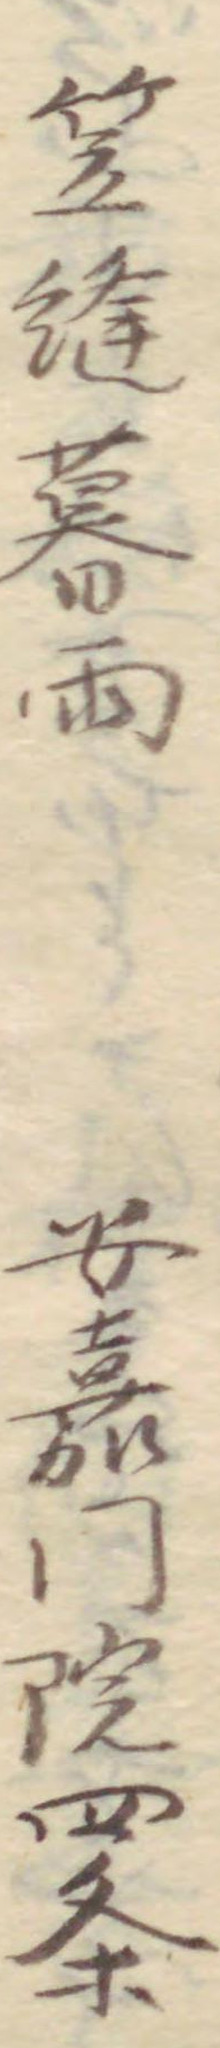笠縫暮雨安嘉門院四条
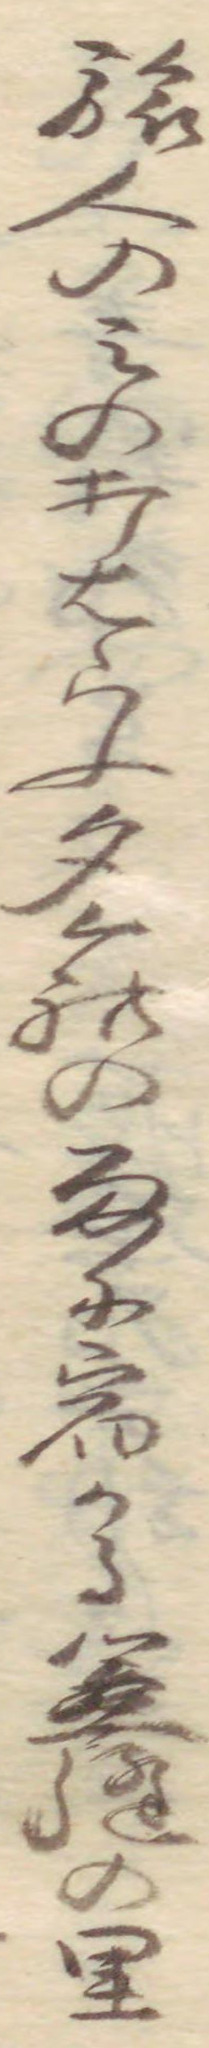旅人のみの打はらふ夕くれの雨に宿かる笠縫の里
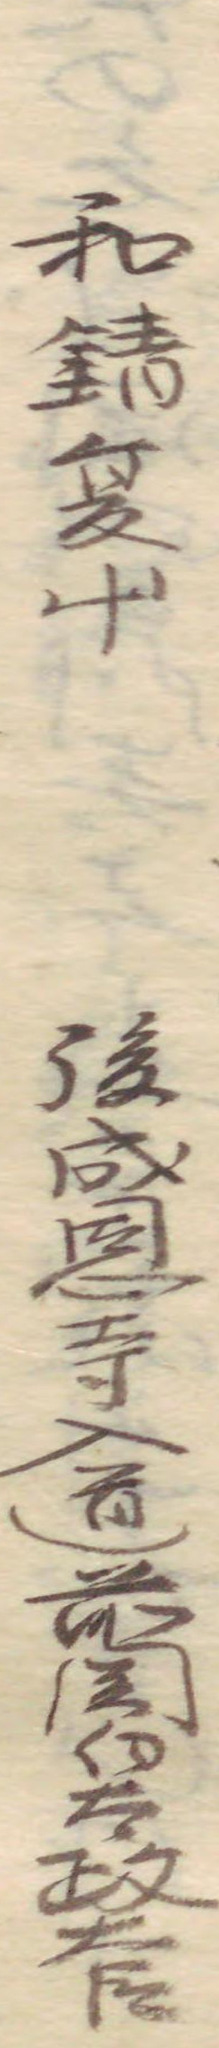和錆夏屮後成恩寺入道前関白太政大臣
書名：鶯宿雑記. 巻263-264
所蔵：国立国会図書館 National Diet Library, JAPAN
